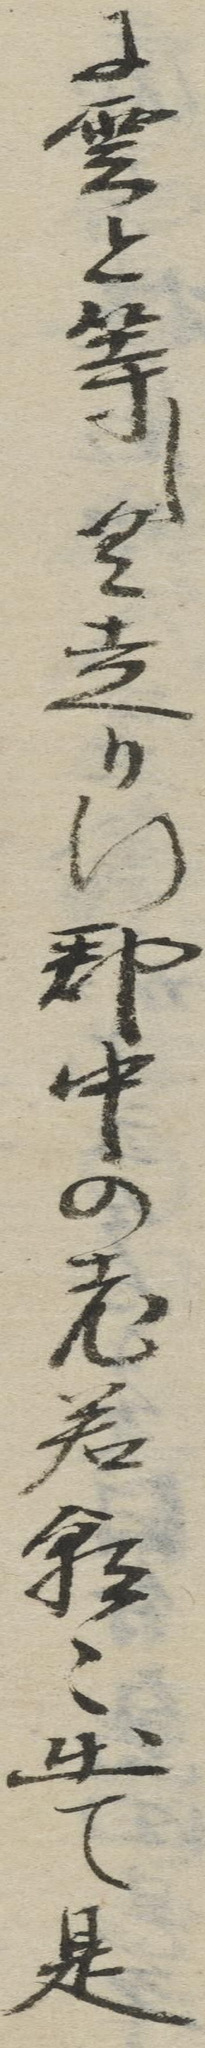に雲と等しく走り行郡中の老若朝ニ？出て是
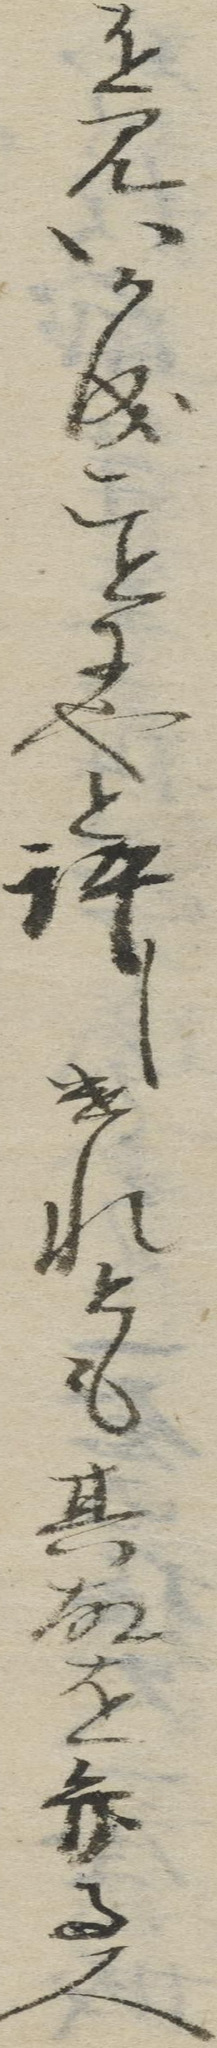を見いか成ことにやと評しけれとも其故を弁る人
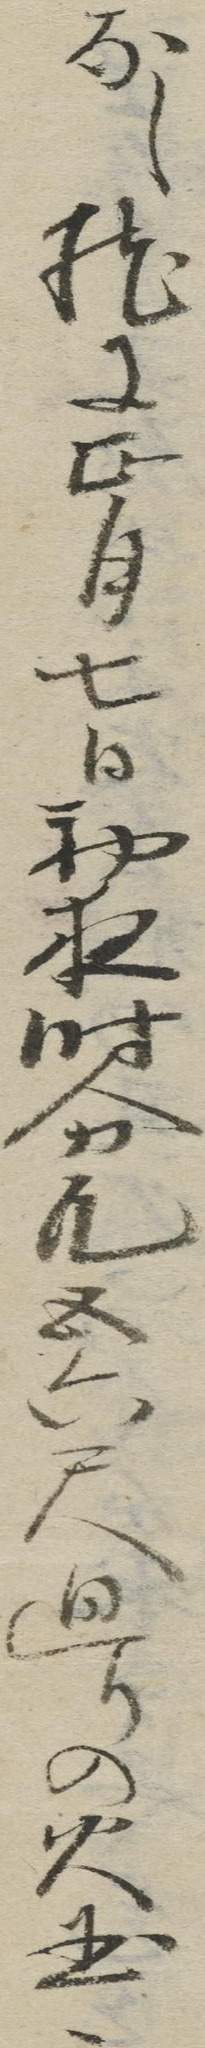なし然に正月七日初夜時分凡五六尺廻りの火玉、
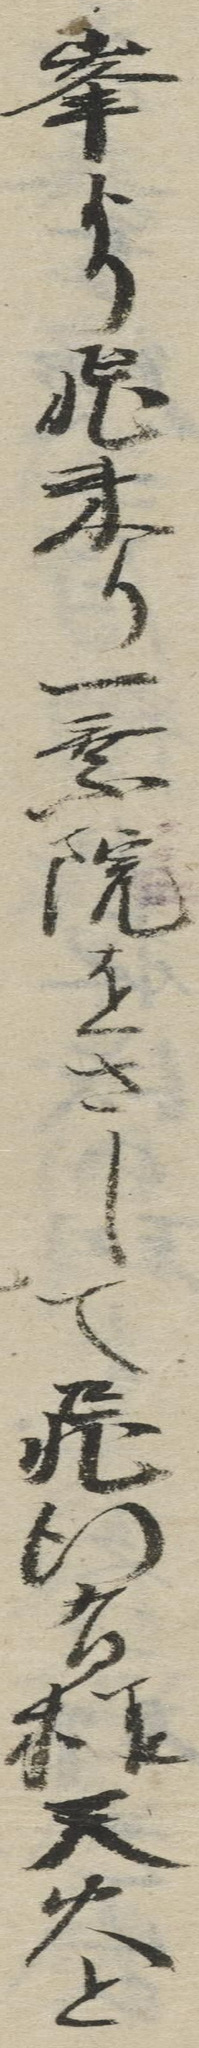峯より飛来り一乗院をさして飛行有様天火と
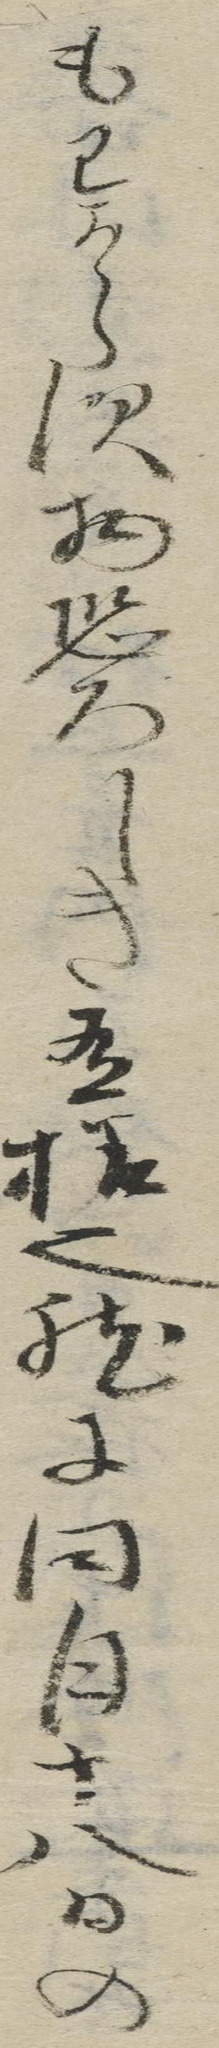もわからす物恐ろしき有様也然に同月十八日の
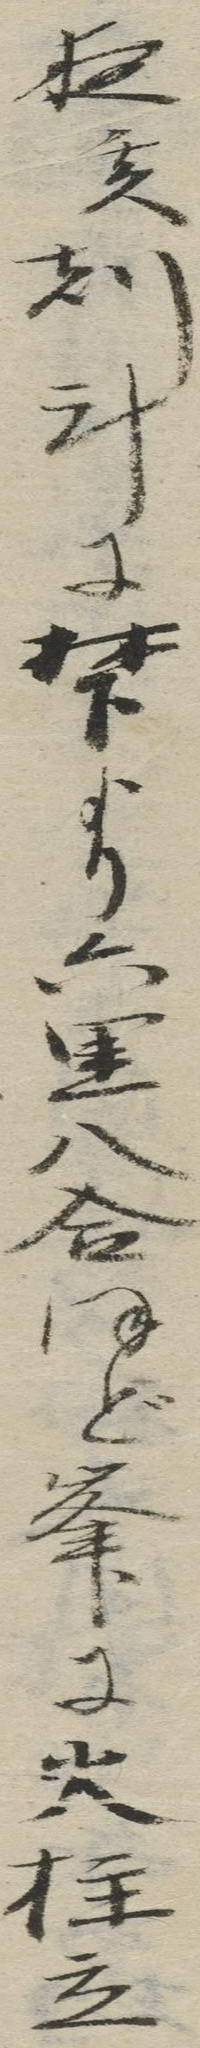夜亥刻計に麓より六里八合ほど峯に火柱立
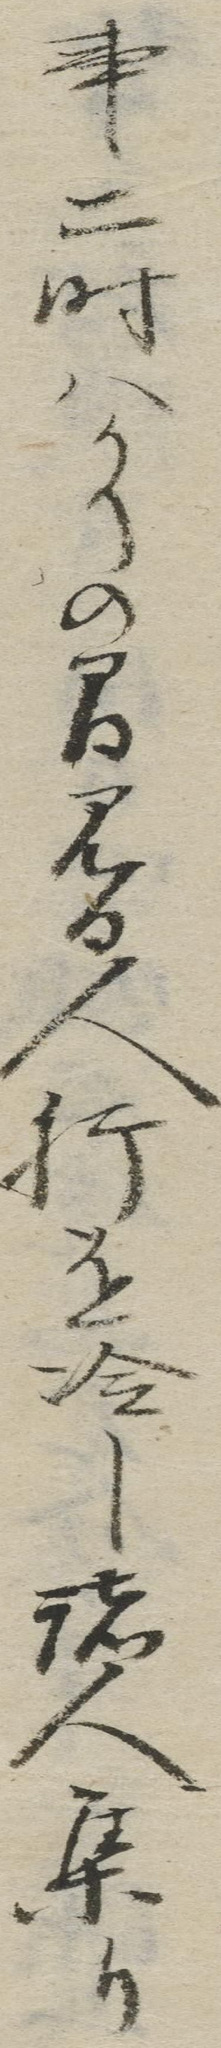事二時ハかりの間見る人肝を冷し諸人集り
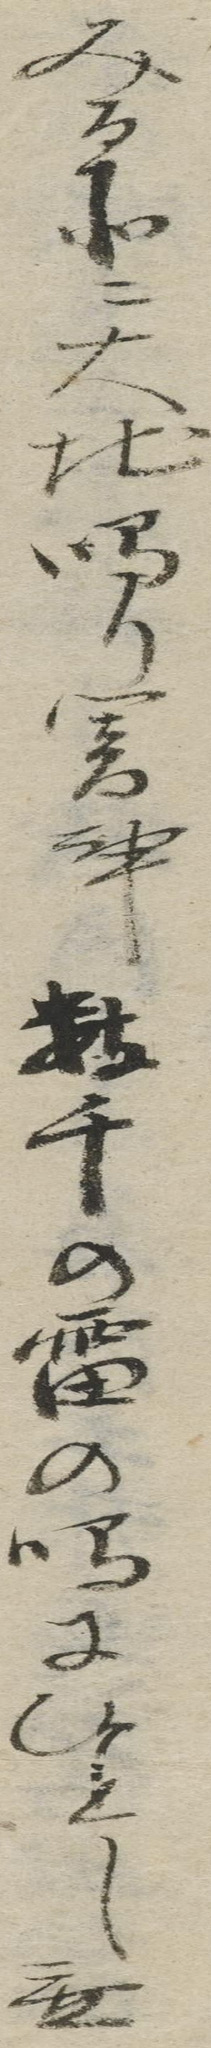みる所ニ大地鳴り響事数千の雷の鳴にひとし無
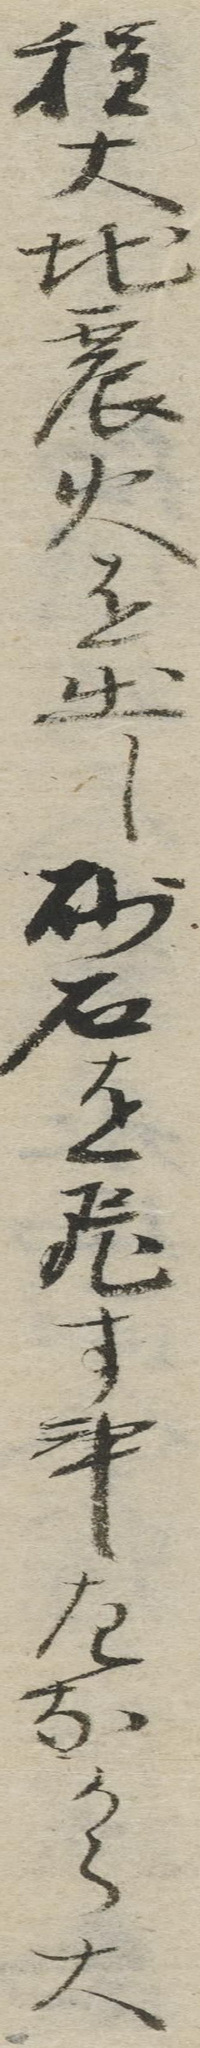程大地震火を出し砂石を飛す事さなから大
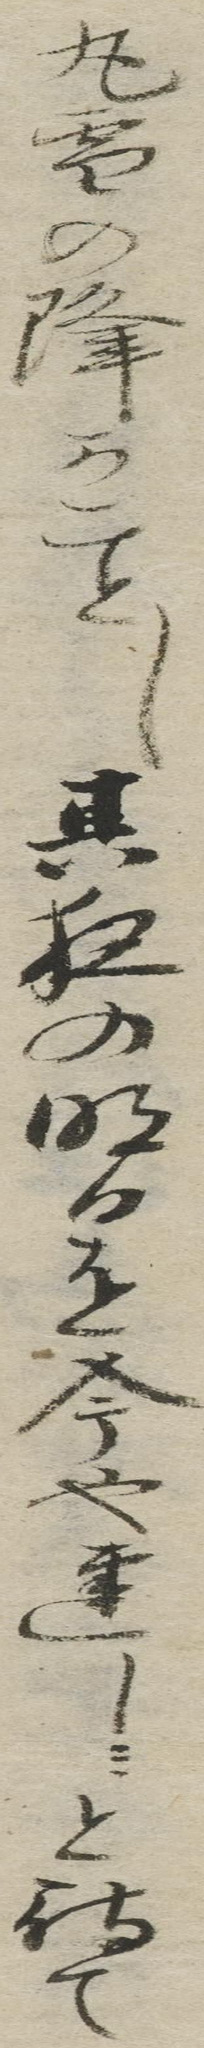丸雹の降かことし其夜の明るを今や遅しと待て
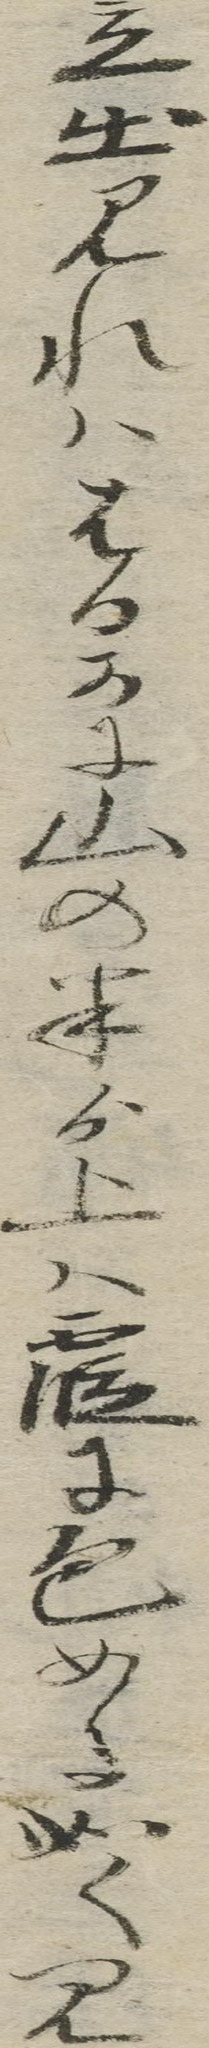立出見れハはるかに山の半ゟ上ハ霞に包める如く見
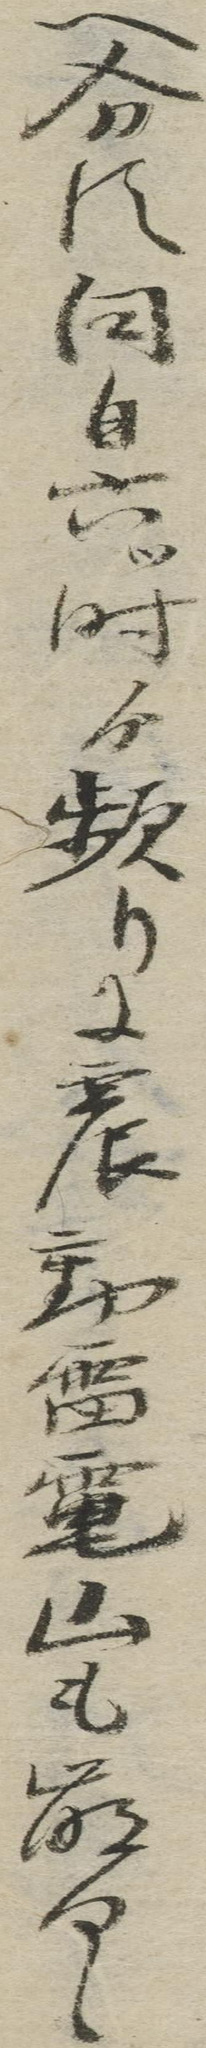へ分す同日六ツ時ゟ頻りに震動雷電山も崩るゝ
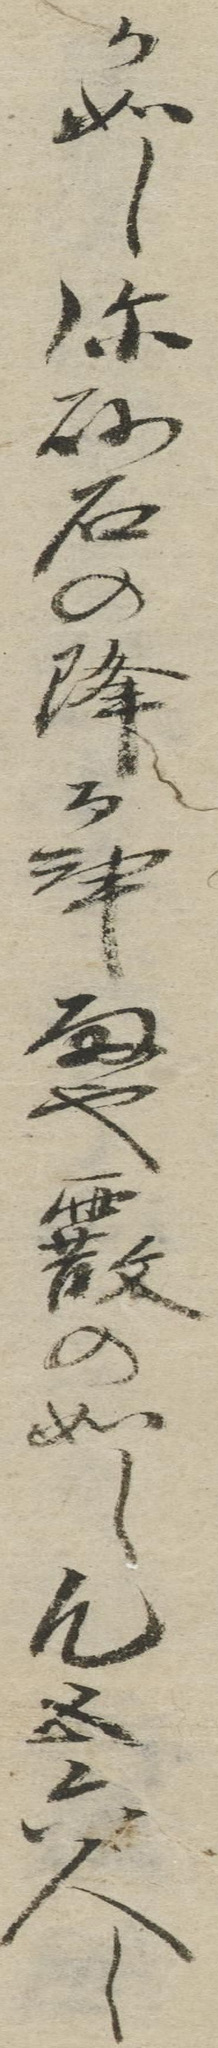か如し弥砂石の降る事雨や霰の如し凡五六人し
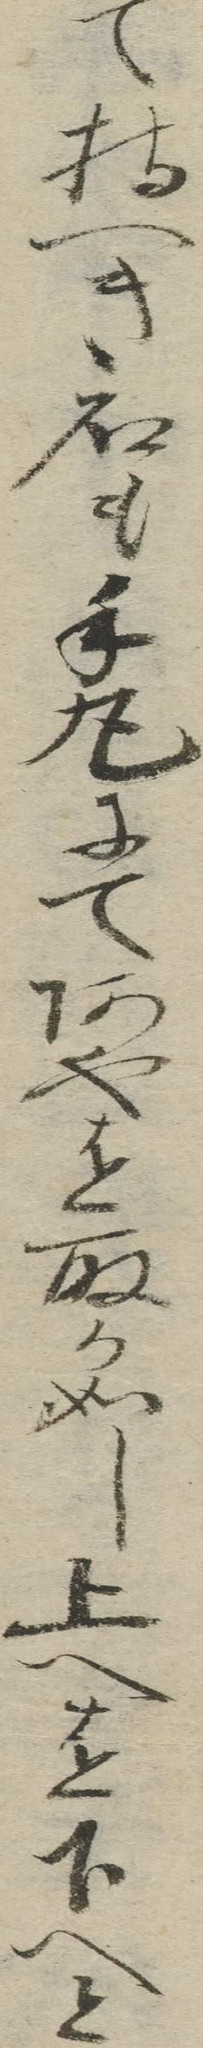て持へき石も手丸にてあやを取か如し上へを下へと

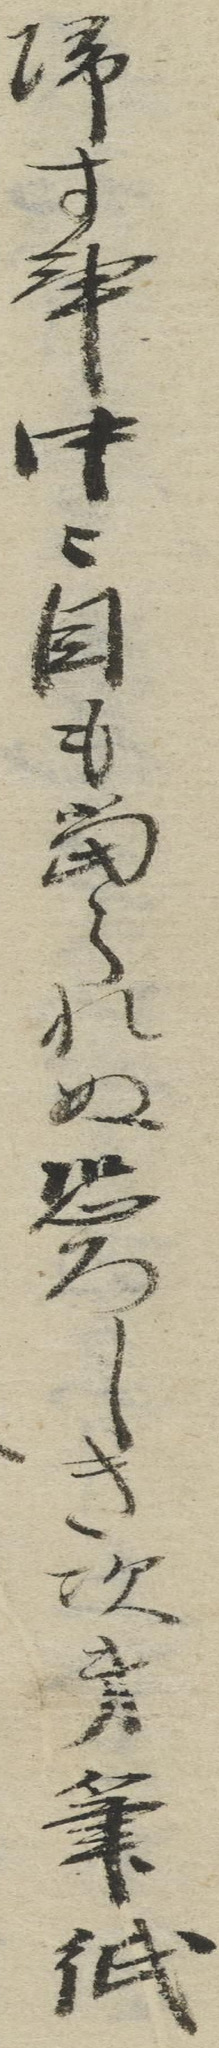帰す事中〻目も当てられぬ恐ろしき次第筆紙
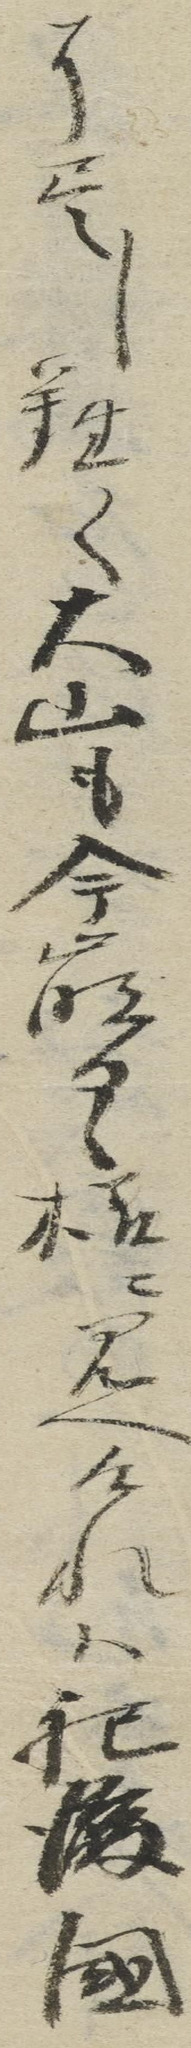に尽し難く大山も今崩るゝ様ニ見へけれハ肥後国
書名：肥前國島原領普賢山大変記　完
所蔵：東京大学地震研究所図書室 Earthquake Research Institute Library, The University of Tokyo, JAPAN
